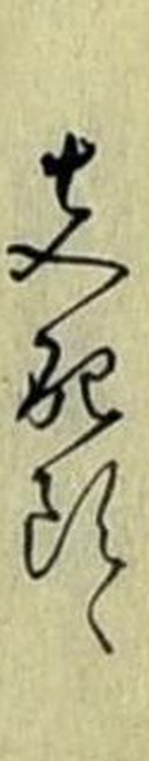支配頭へ
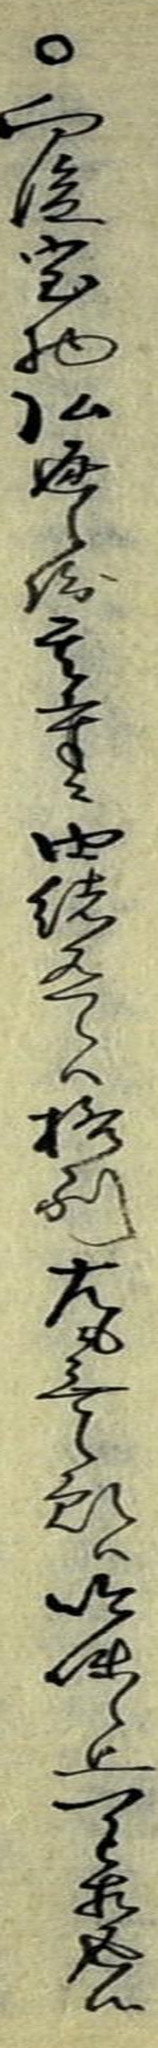〇向後宝物弘通之儀其寺々由緒有之は格別左も無之願は吟味之上可被相返候
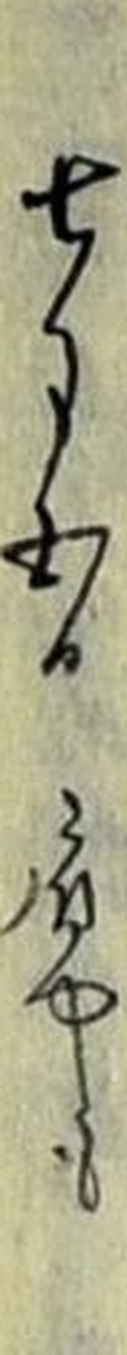七月五日府中へも
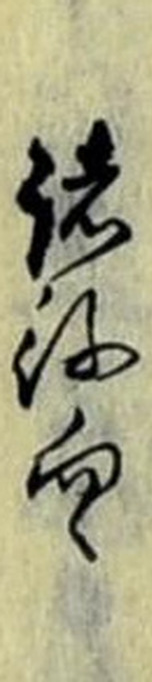諸役向へ
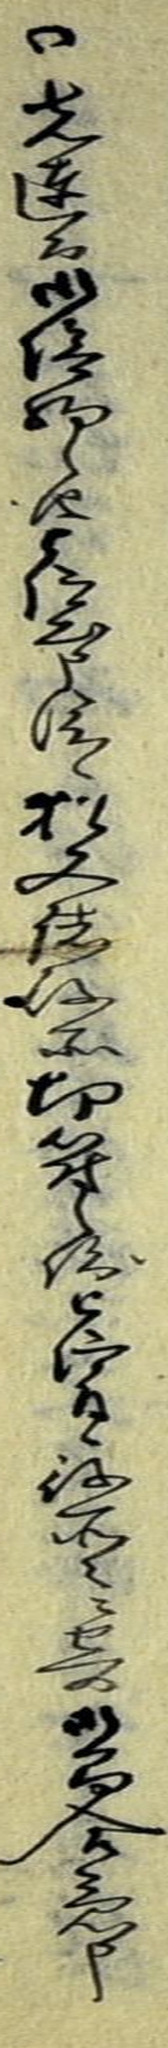〇先達而御倹約之儀被仰出申渡候猶又諸役所切符之儀被仰付候役所々に寄御間合兼申
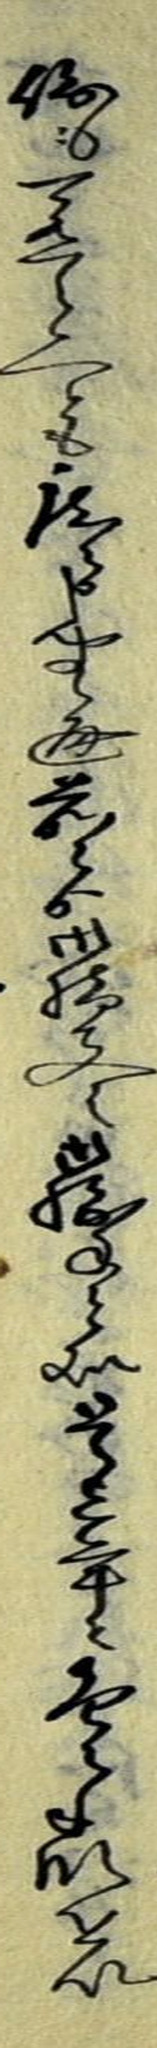儀も可有之候へとも度々申聞候通前々ゟ御指支之御勝手に候処是迄年々色々手段を以

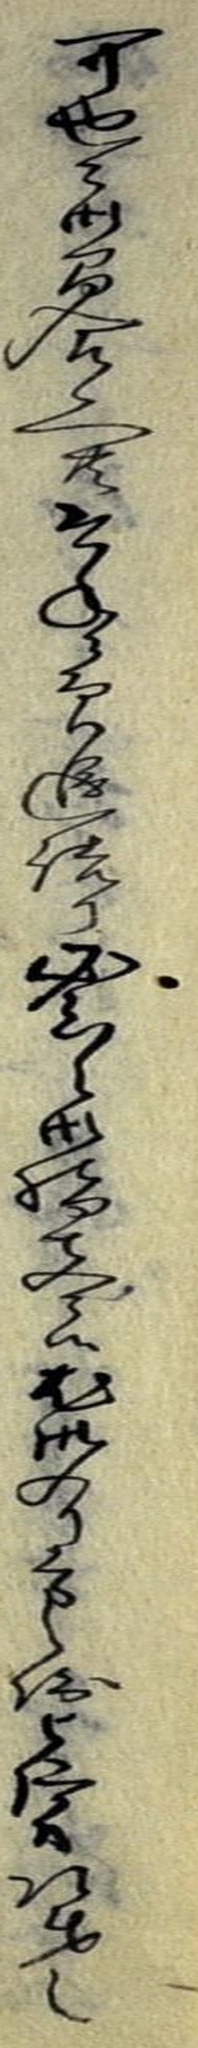可也に御間合候へ共今年に而は追詰り必至之御指支に候尤御〆り方之儀被仰付次第之
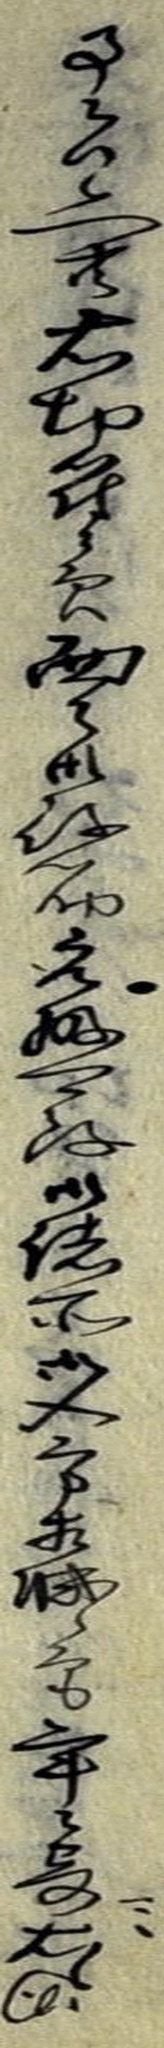事には候へ共右切符に而は面々御役筋取扱可致御諸所御入方相減候而も年に寄右之趣
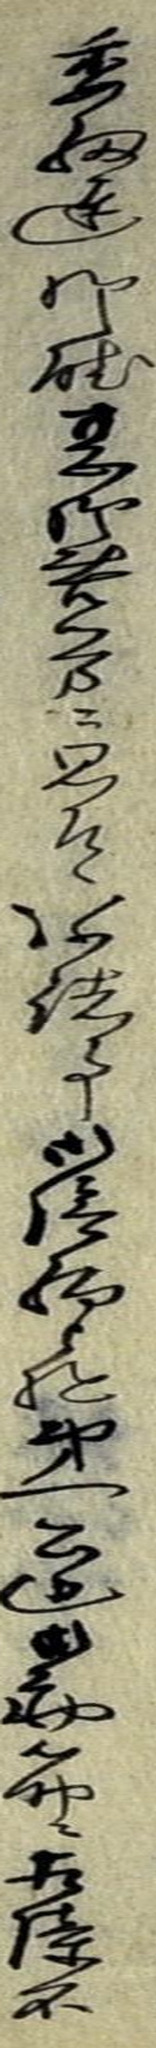委細達御聴甚御苦労に思召候弥諸事御倹約被遊第一公辺御勤筋に相障不
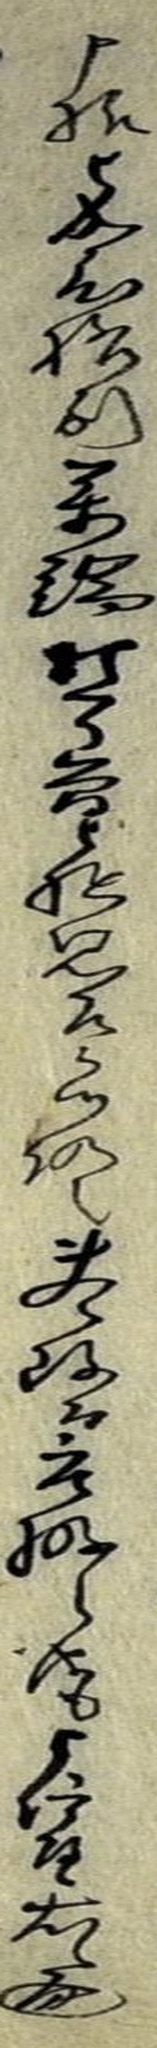申様被成度格別万端御了簡被遊思召に候仍之夫々改而取扱之儀も被仰付候右之通
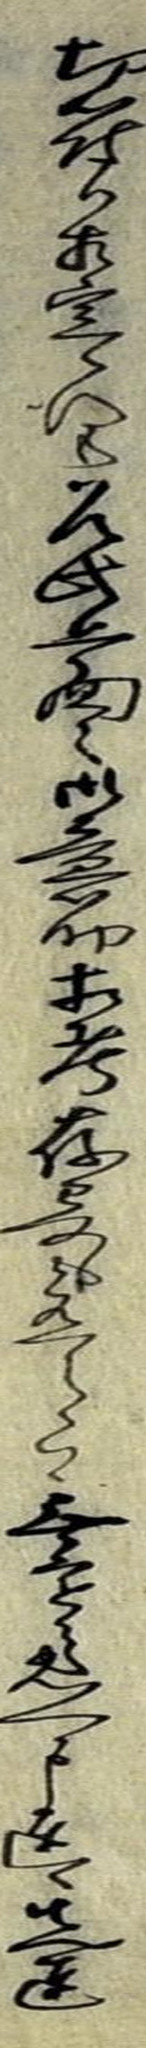切符は相定候得共乍此上面々御益筋相考存寄も有之候はゝ無遠慮可申達候先達
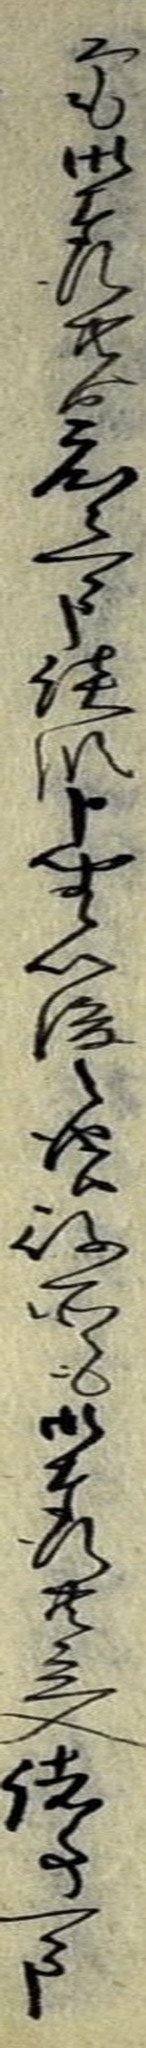而も御奉行共ゟ度々可申談段申聞以後之儀は役所へも御奉行共立入諸事可申
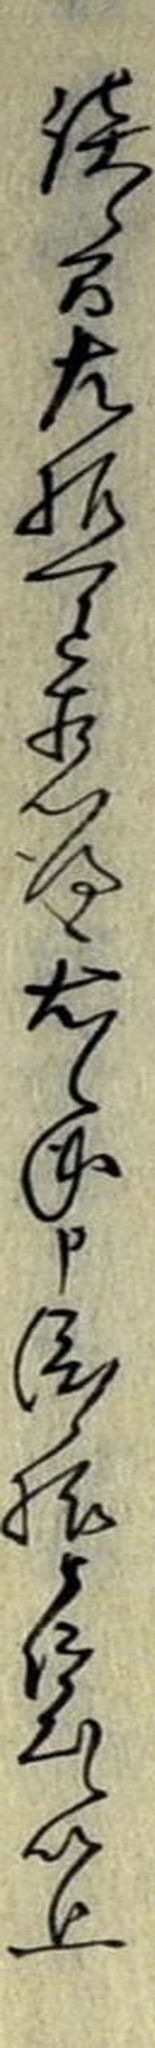談候間左様可被相心得候右之趣申渡候様被仰出候以上
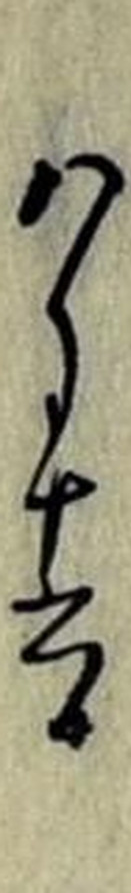八月十六日
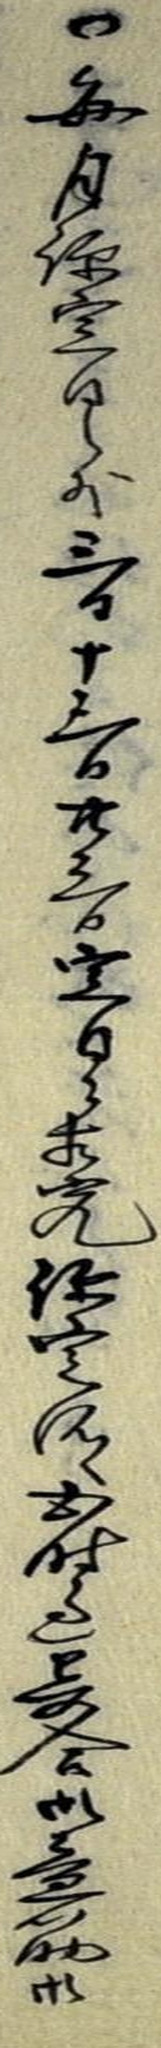〇毎月評定日之外三日十三日廿三日定日に相究評定所へ五時過寄合御益筋御
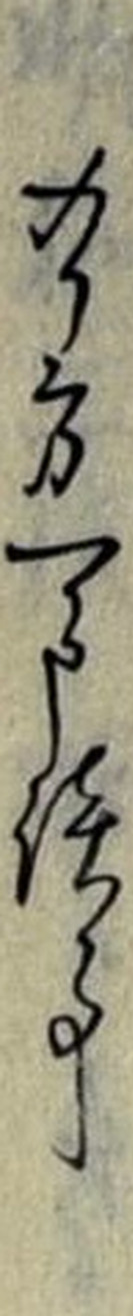〆り方可申談事
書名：命令之部 二
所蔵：福井県文書館 Fukui Prefectural Archives
